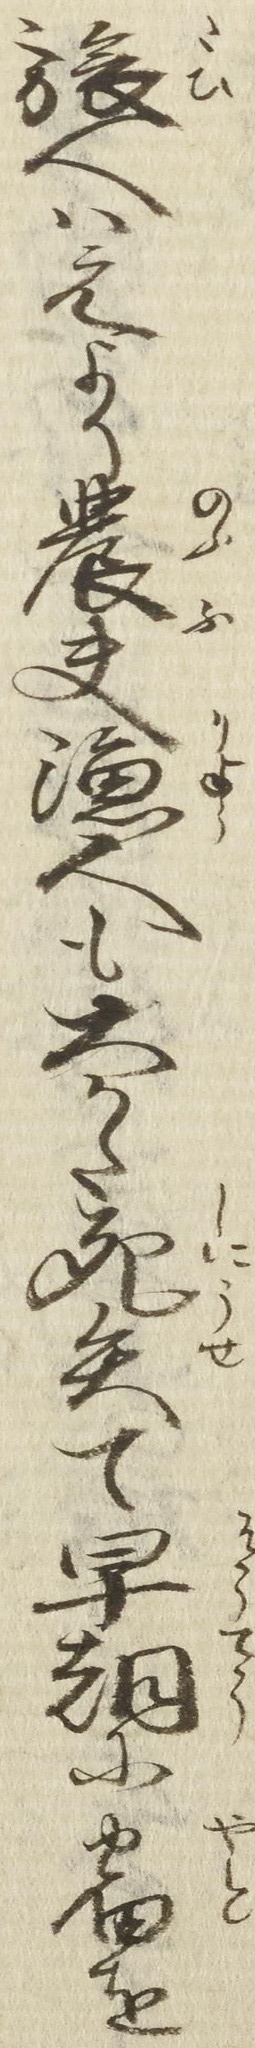旅人は元より農夫漁人も大かた死失て早朝に宿を
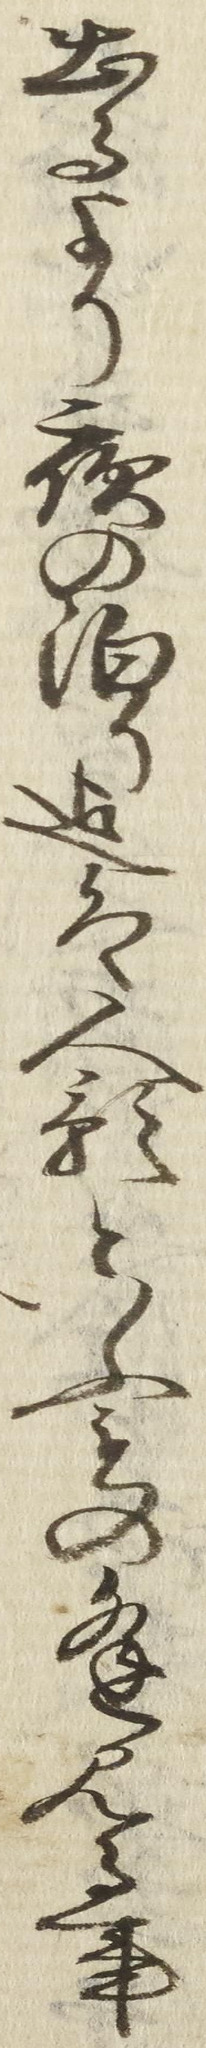出るより夜の泊り迄は人影といふもの逢見る事
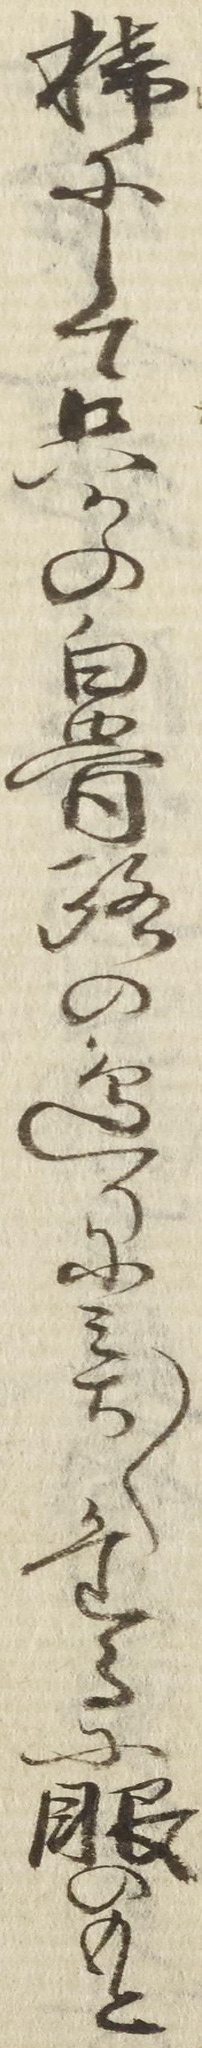稀にして只かの白骨路の辺りにみち〳〵たるに眼のもと
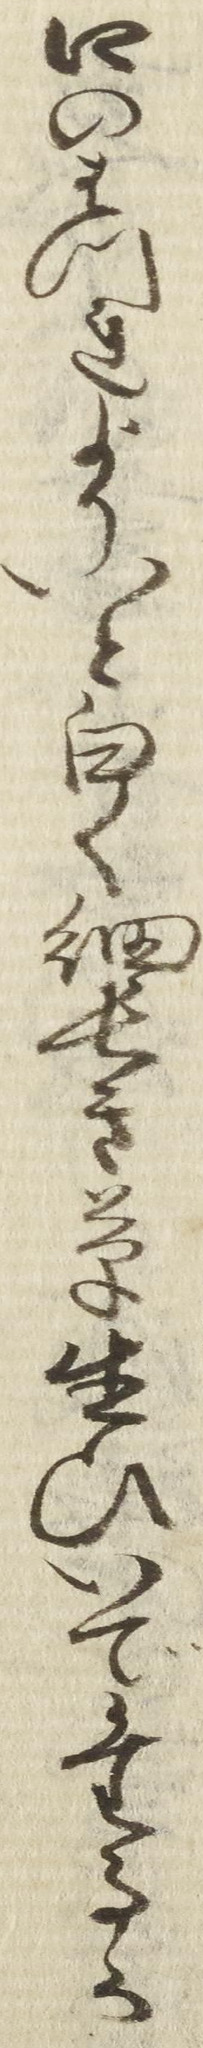口のまつれよりいと白く細長き草生ひいでたるか
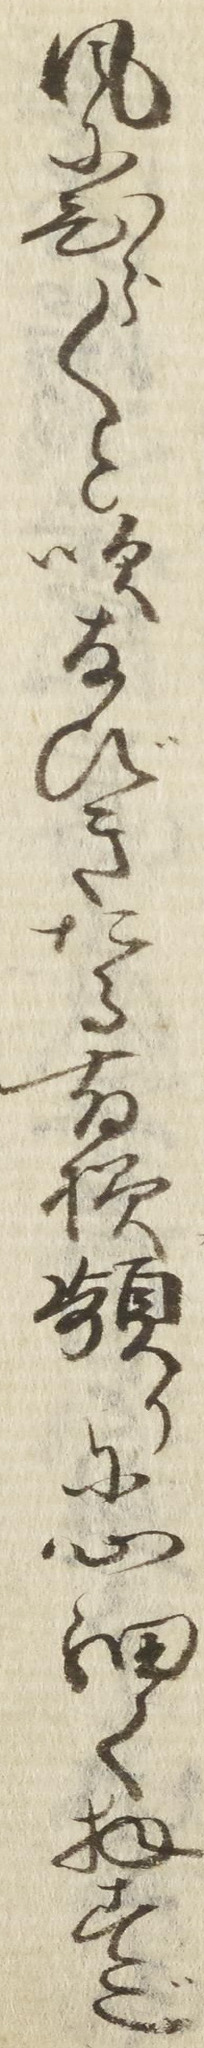風にひら〳〵と吹なびきたる有様頻りに心細く物すご
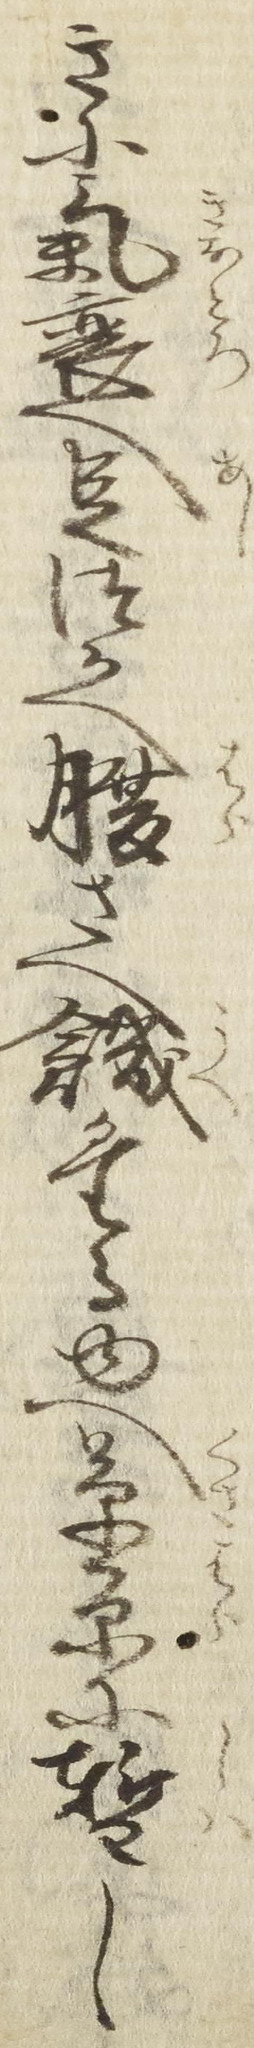きに気衰へ足つかへ腹さへ餓たるゆへ草原に暫し
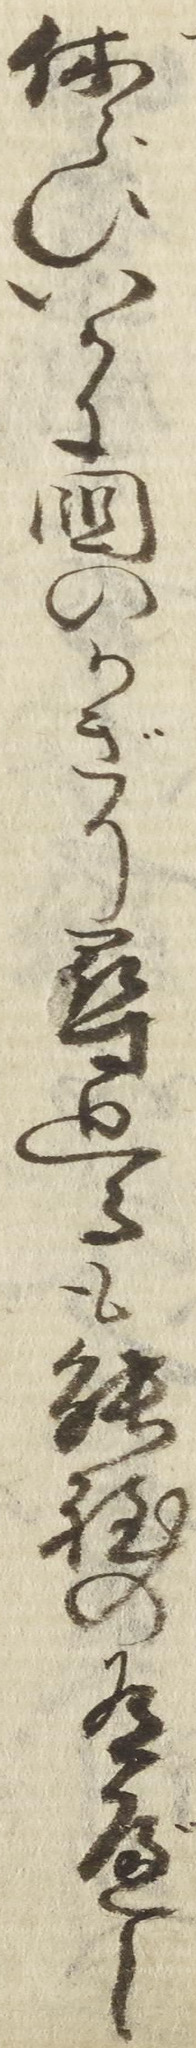休らひいかに国のかぎり尋廻るも能程の有べし

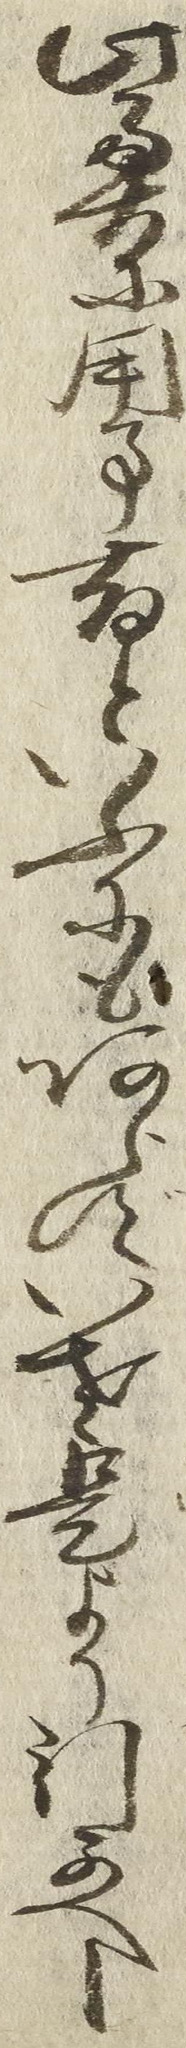此奥に用事有といふにもあらずいさ是より引かへし
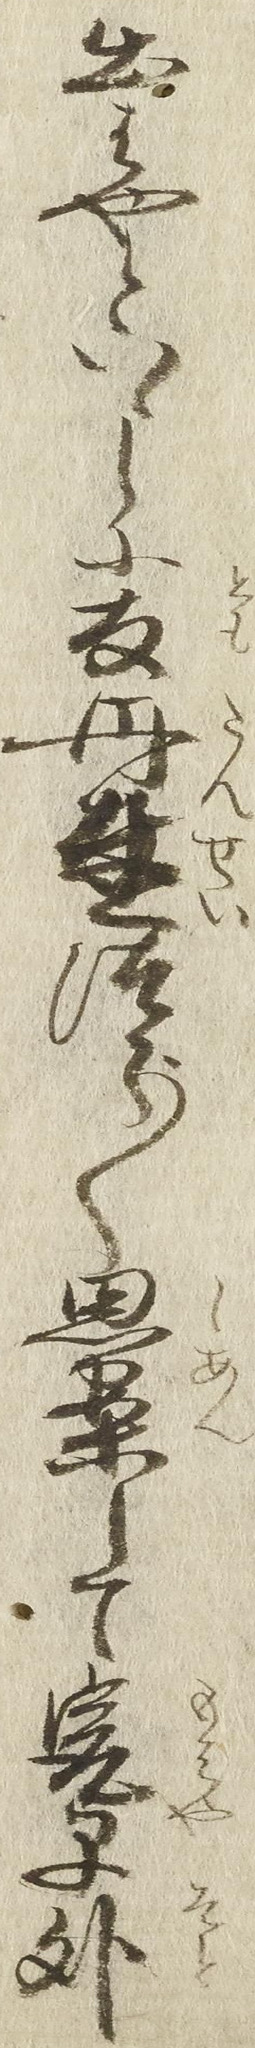出はやといゝしに友丹生つら〳〵思案して最早外
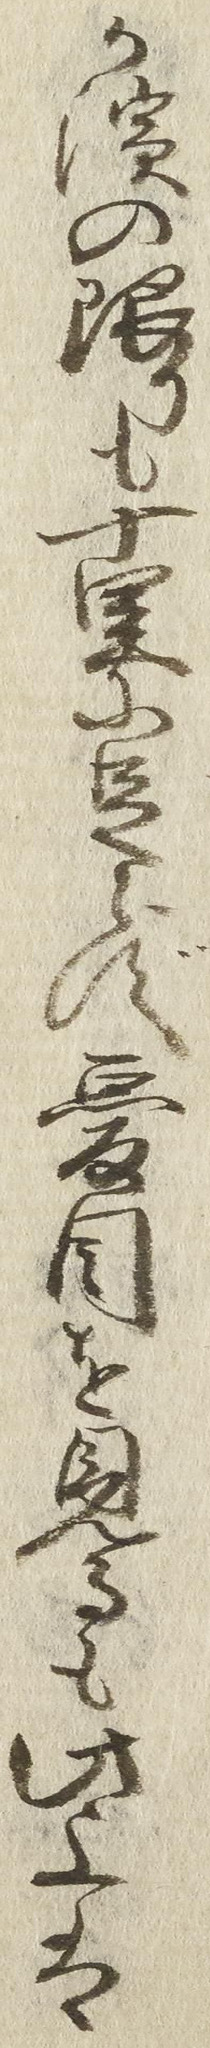ヶ浜の限りも十里に足らず憂目を見るも此上は
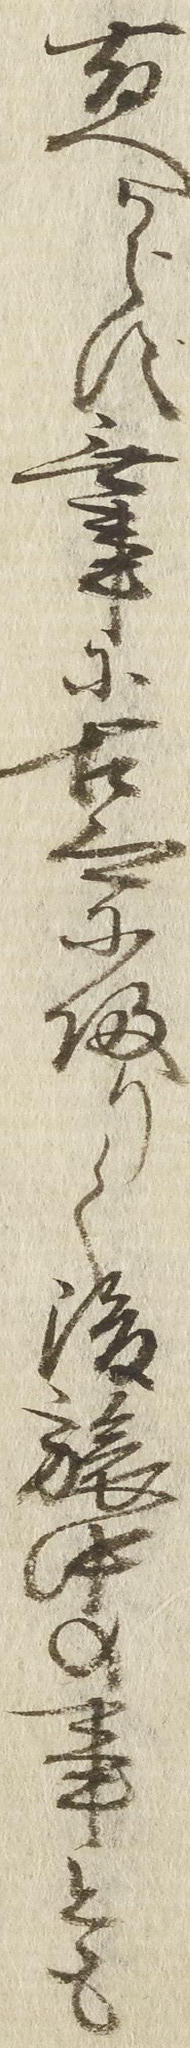有べからず無事に古郷に帰りて後旅中の事とも
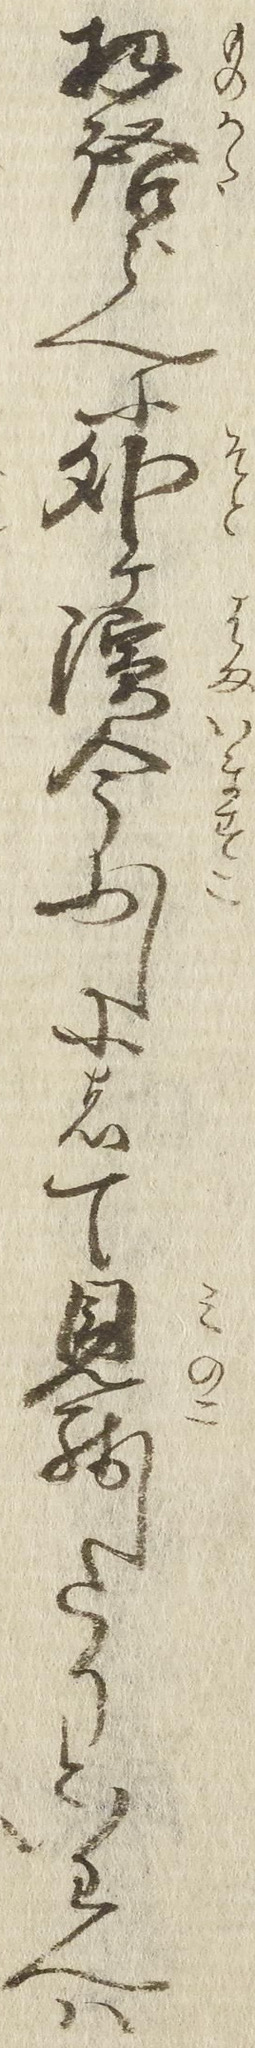物語らんに外ヶ浜今少しにして見残したりといわんは
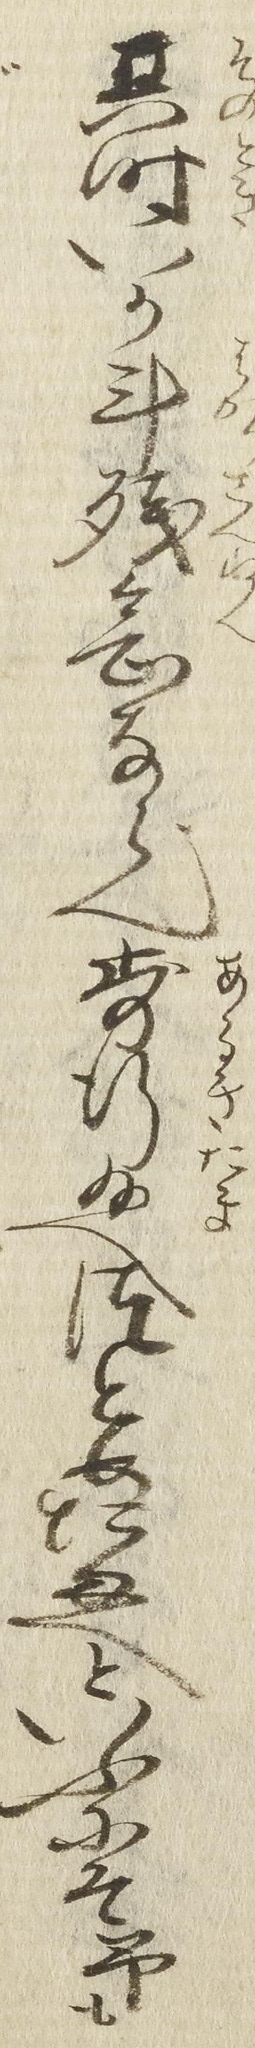其時いか斗残念ならん歩行給へつとめたまへといふにそ予も
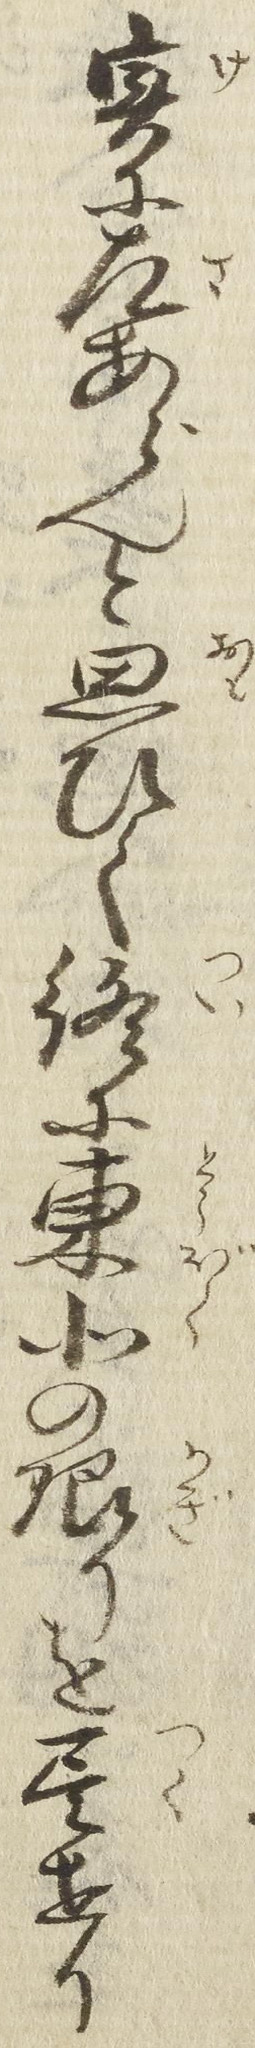実に左あらんと思ひて終に東北の限りを尽せり
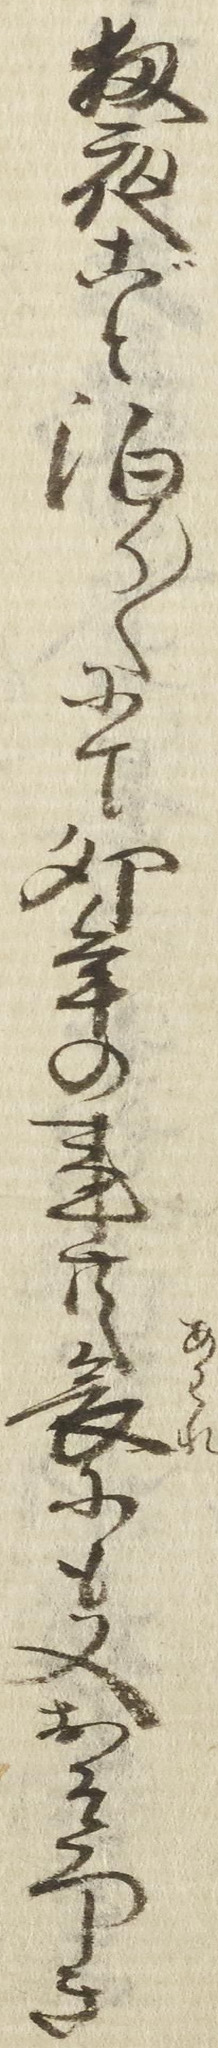扨夜ごと泊り〳〵にて卯年の事共哀にも又おそろしき
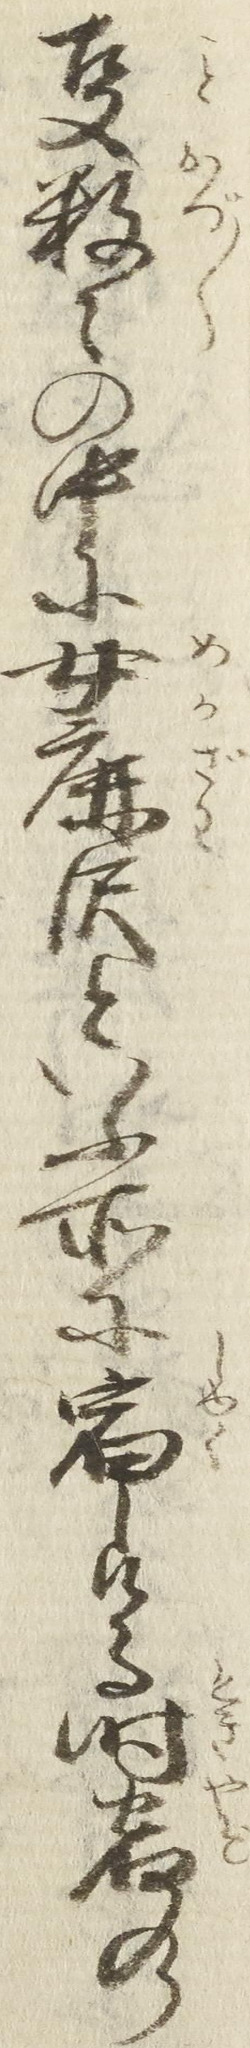事数〻の中に女鹿沢といふ所に宿しける時宿の
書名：天明奇畧　全
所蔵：東京大学地震研究所図書室 Earthquake Research Institute Library, The University of Tokyo, JAPAN
